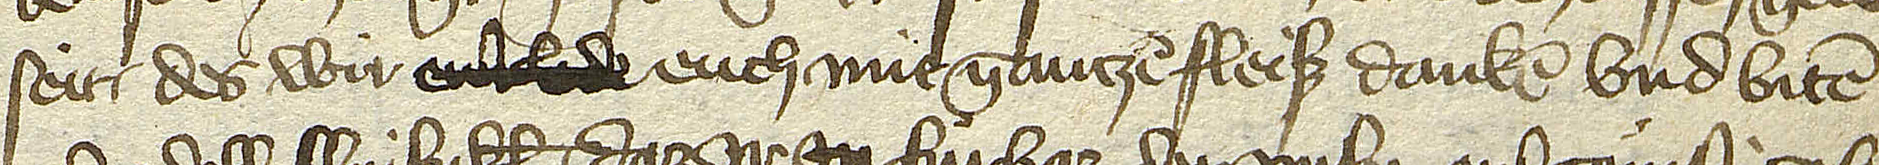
ſeit / des wir ew*r%%%% euch mit gancʒe* fleiſʒ danke* vnd bite*
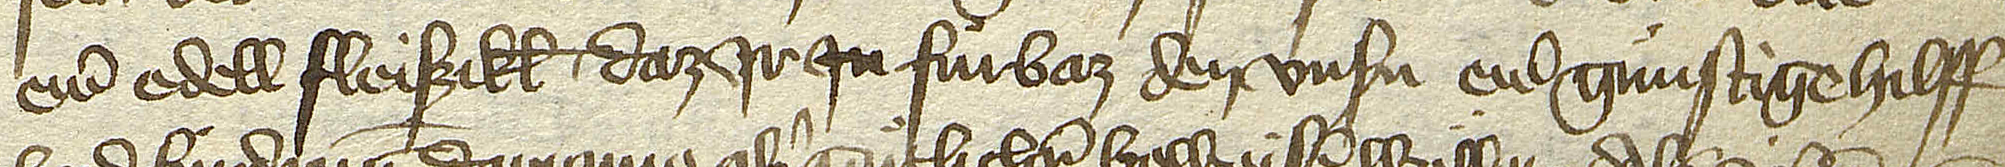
ew* edell fleiſʒikl* / daʒ Ir In fürbaʒ den vnſ*n ew* günſtige hilff
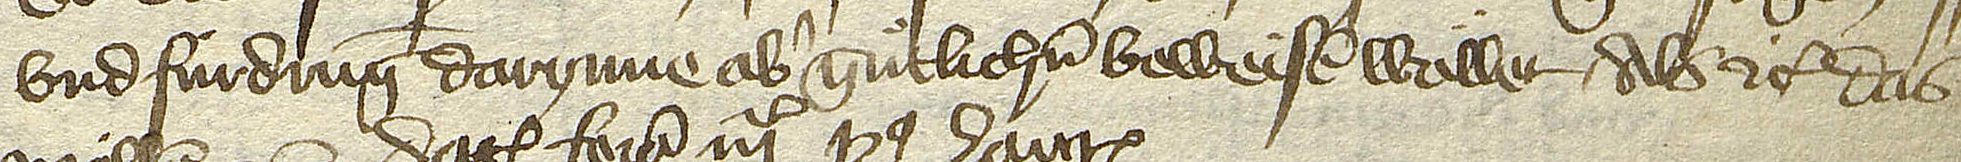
vnd fürdrug* darynne ab* gütlichn* beweiſe* wöllet / Als ec* das
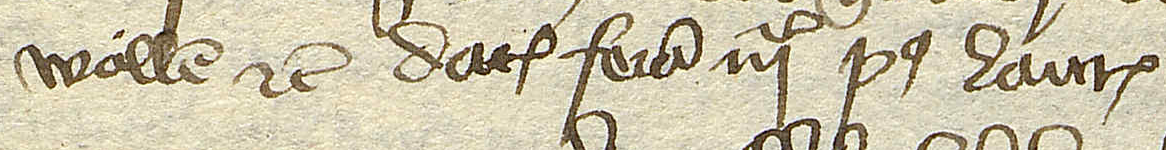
wölle* ec* dat* feia* iii* p* Laur*
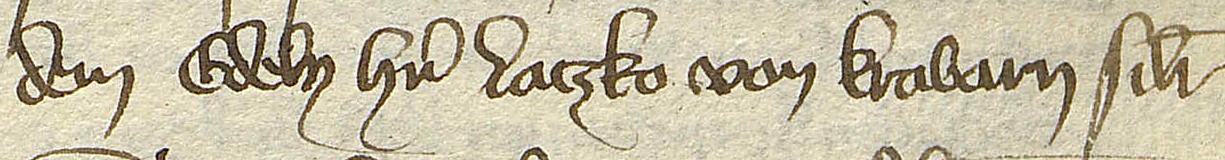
den Edeln hn* lacʒko von krabarn ſilr*
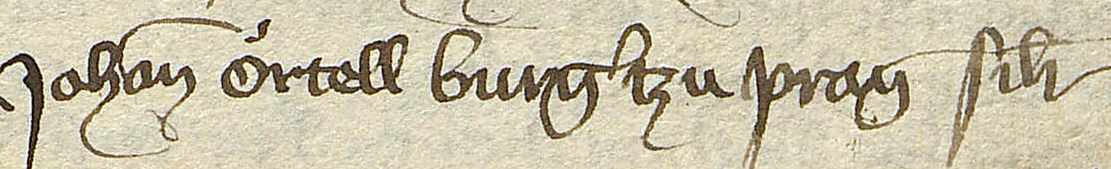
Iohan Örtell burg* cʒu prag ſilr*
